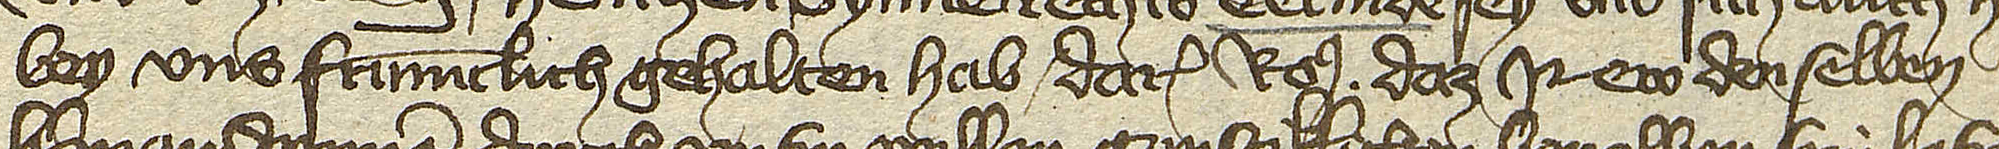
bey vns frumclich* gehalten hab / dar* Ro* . daʒ Ir ew denſelben
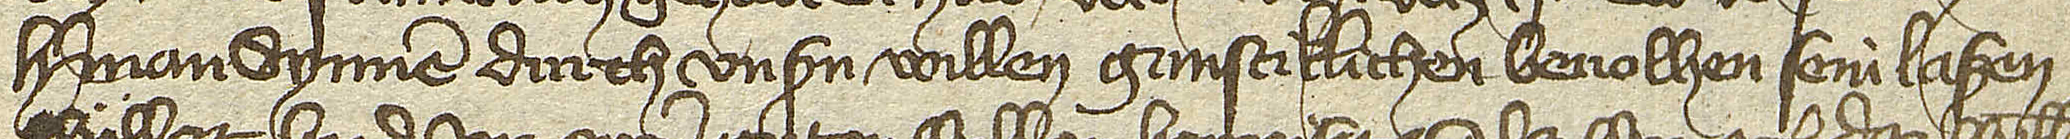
h*man Synne* durch vnſ*n willen gunſtiklichen beuolhen ſein laſʒen
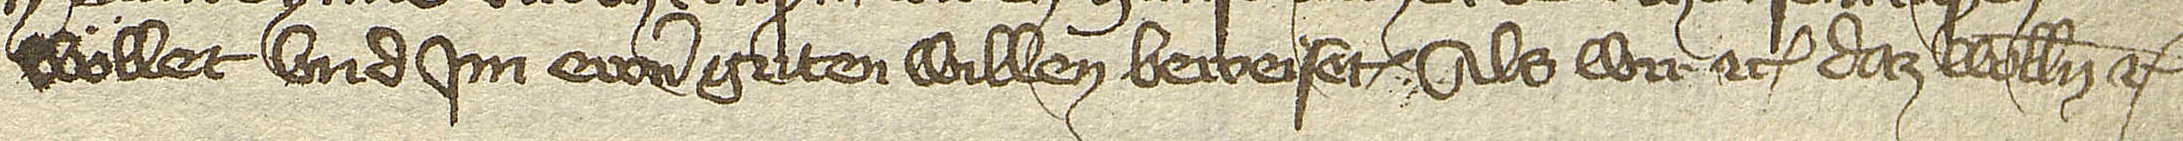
wöllet vnd Im ewn* guten willen beweiſet Als wir ec* daʒ wolln* ec*
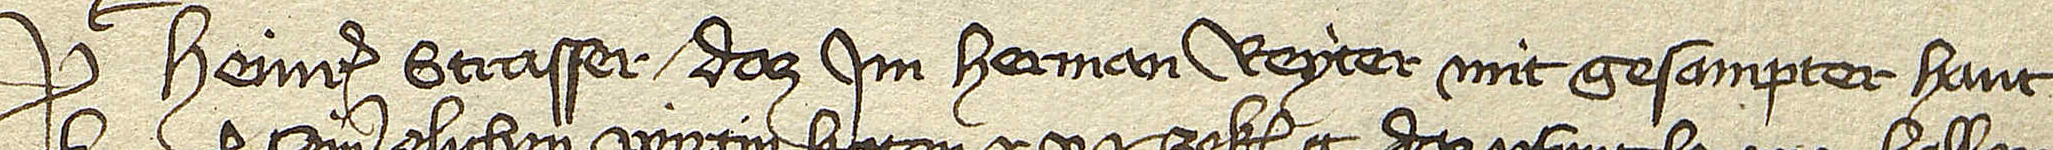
P* heim* Straſſer / daʒ Im herman Reyter mit geſampter hant
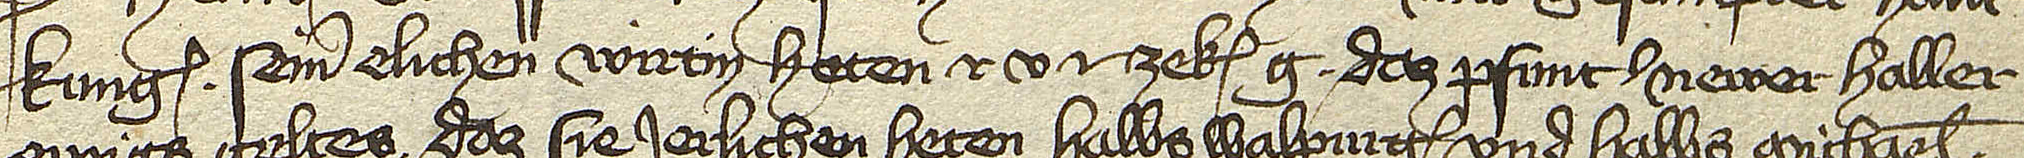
kung* . ſein* elichen wirtin heten r v r cʒek* g. daʒ pfunt newer haller
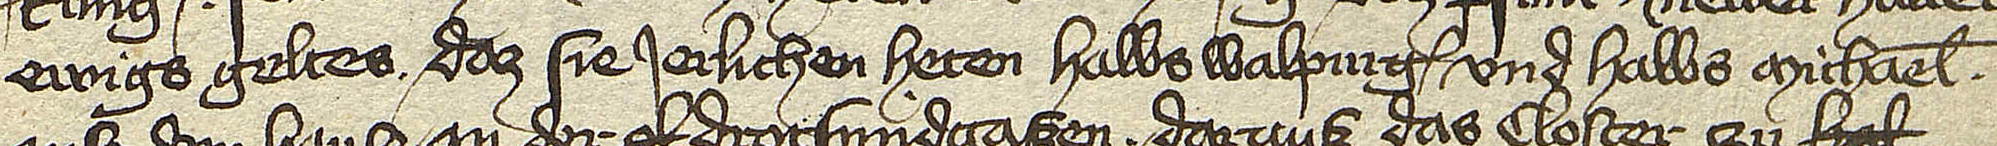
ewigs geltes / daʒ ſie Ierlichen heten halbs walpurg* vnd halbs Michael*
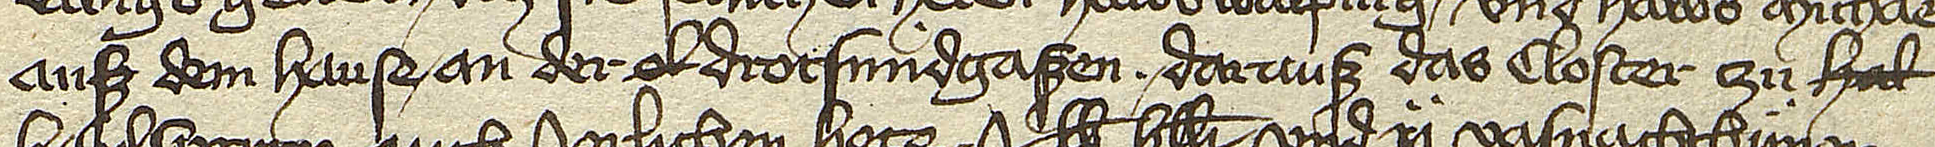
auſʒ dem hauſe / an der el drotſmidgaſʒen . / darauſʒ das Cloſter cʒu hal
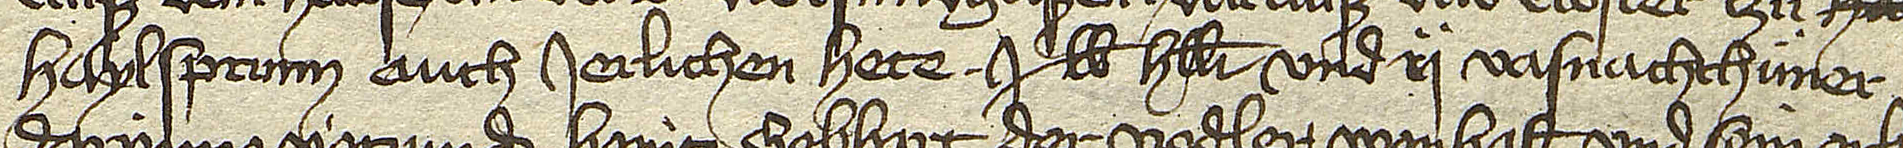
haylſprunn auch Ierlichen hete . I lb hllr vnd ii vaſnachthüner
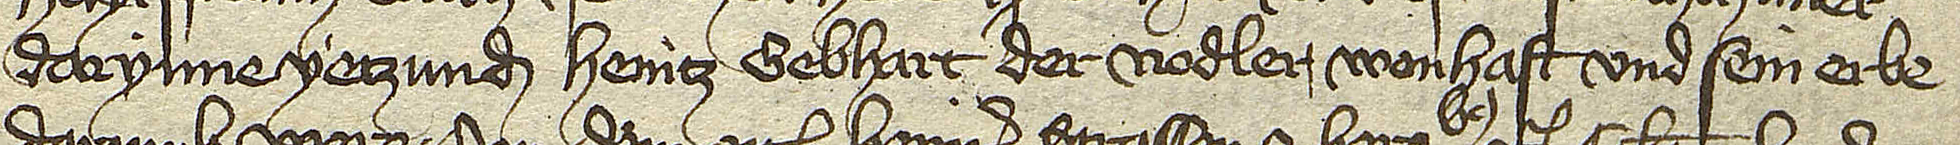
darynne yecʒund* heincʒ Gebhart der nodler wonhaft vnd ſein erbe
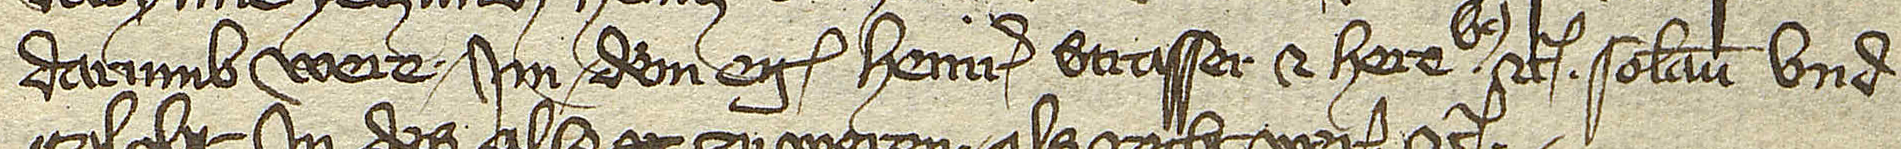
darumb were / Im / dem eg* heinr* Straſſer @ here ec*. ſolau* vnd
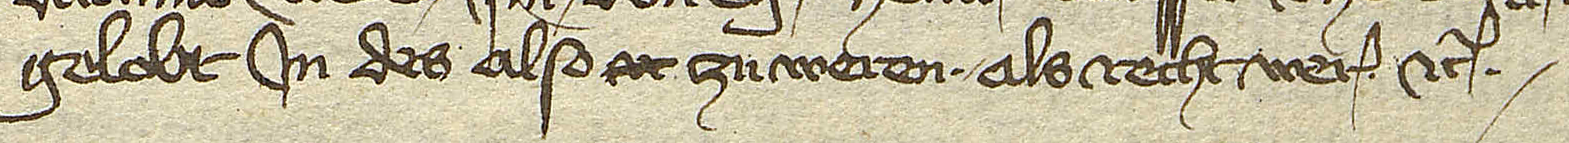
gelobt In des alſo w cʒu weren . / als recht wer* ec* . /
